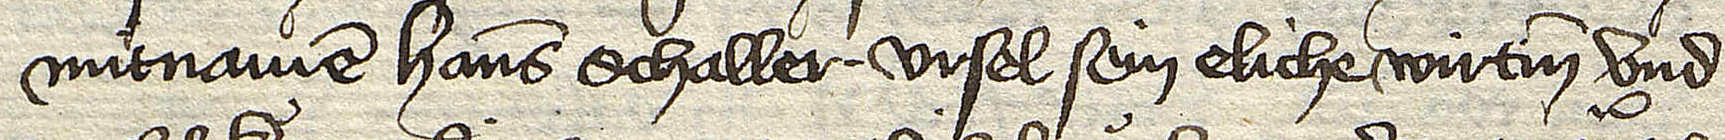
mitname* han*s Schaller . vrſel ſein eliche wirtin* vnd
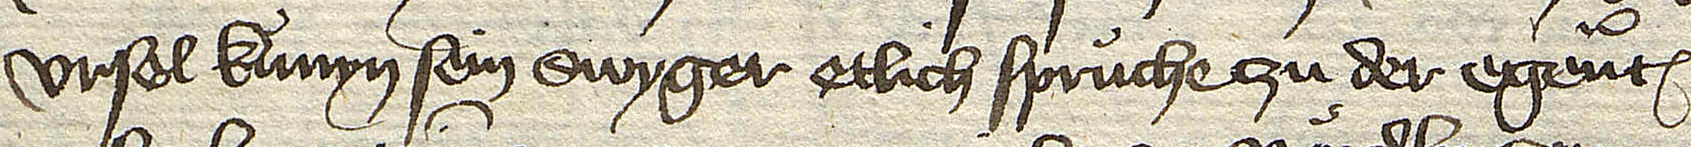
vrſel künyn ſein Swyger etlich ſprüche cʒu der egent*
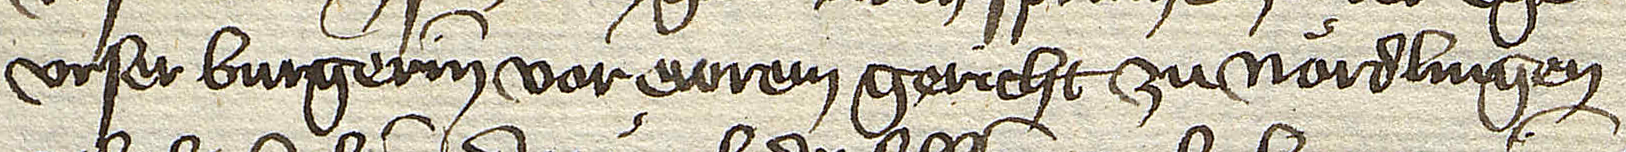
vnſer burgerin* vor ewren gericht cʒu Nördlingen
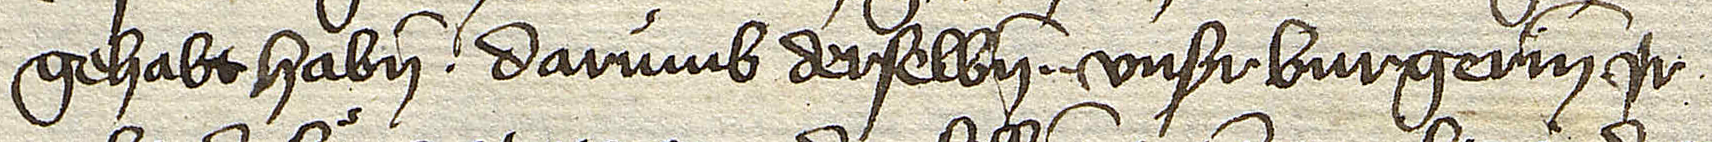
gehabt habn* . Darümb derſelbn* ~ vnſ*r burgerin* Ir
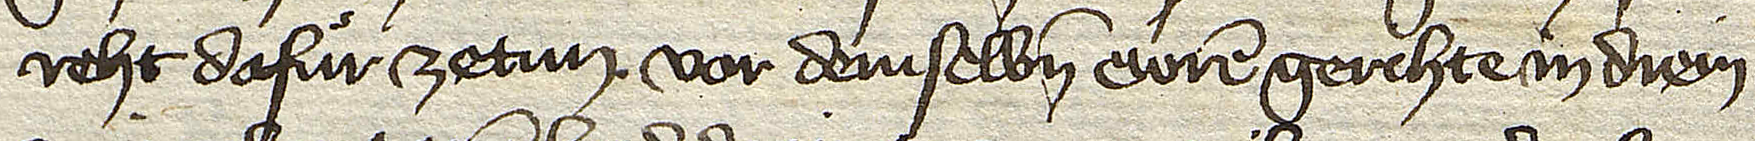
reht dafür cʒetun . vor demſelbn* ewre* gerihte in die in
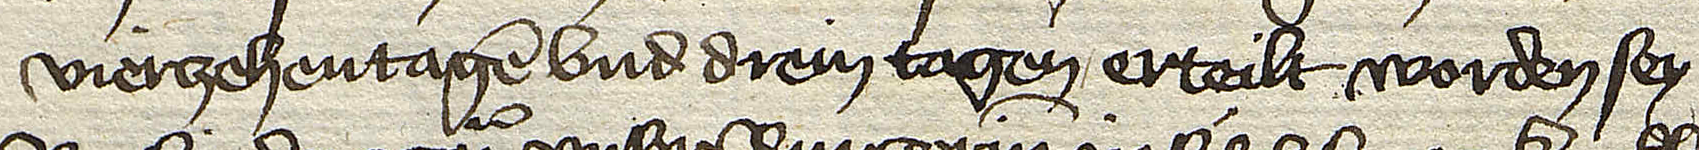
viercʒehentage* vnd drein tagen erteilt worden ſey
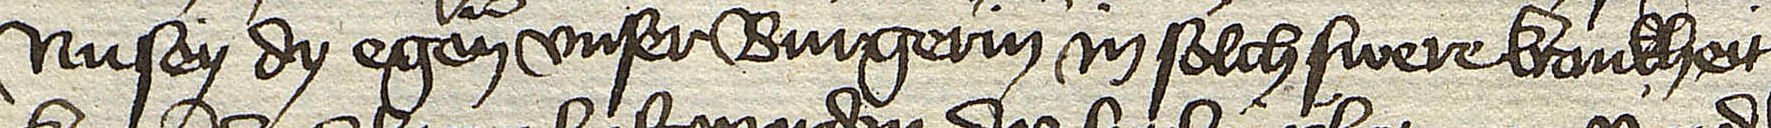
Nu ſey dy egen* vnſer Burgerin* in ſölich ſwere krankheit
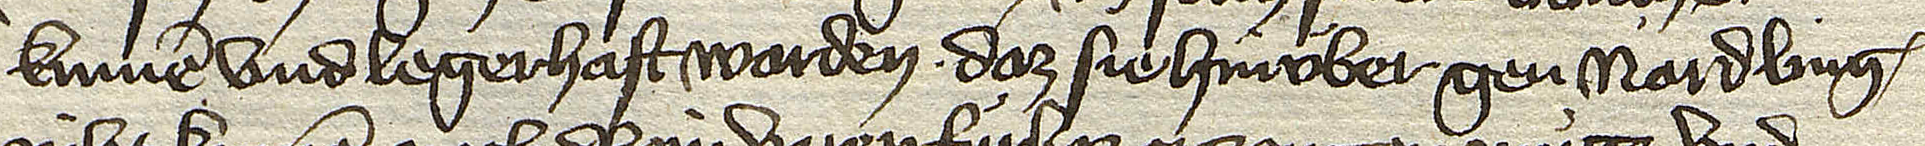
kume* vnd legerhaft worden . daʒ ſie hinv̈ber gen Nördling*
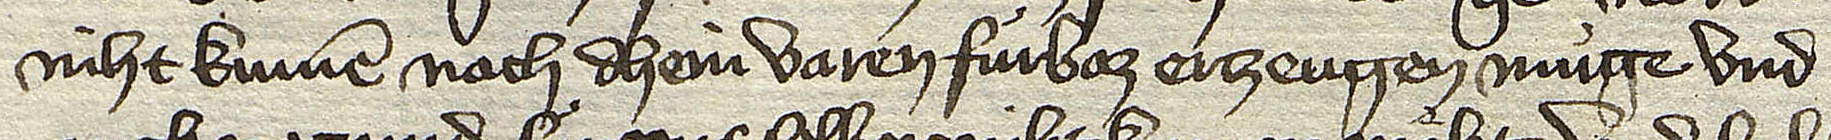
niht kume* noch dhein varen fürbaʒ ercʒeugen müge vnd
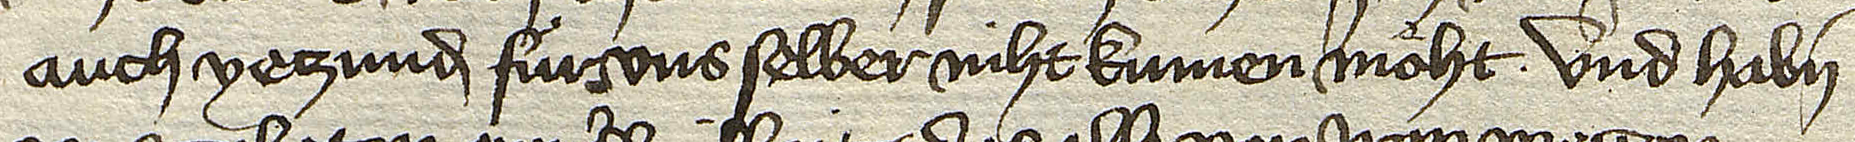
auch yecʒund* für vns ſelber niht kumen möht . vnd habn*
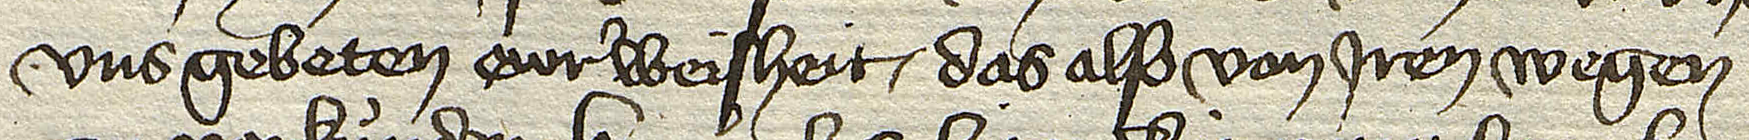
vns gebeten ewr* weiſheit / das alſo von Iren wegen
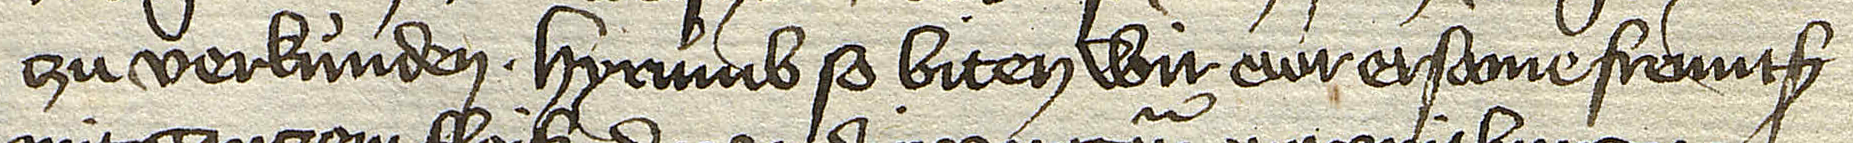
cʒu verkünden . Hyrümb ſo biten wir ewr erſame freuntſ*
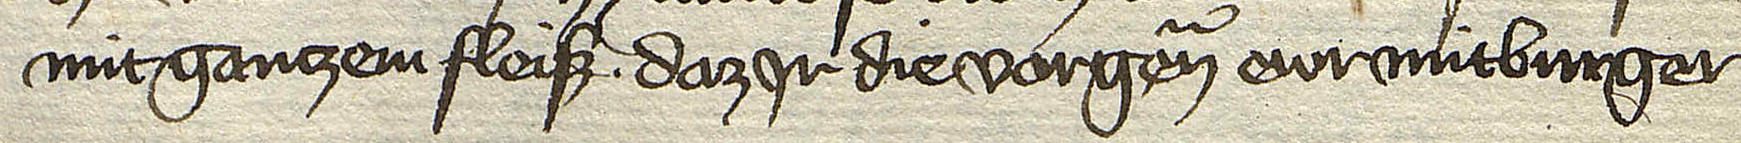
mit gancʒem fleiſʒ . daʒ Ir die vorgen* ewr mitburger
